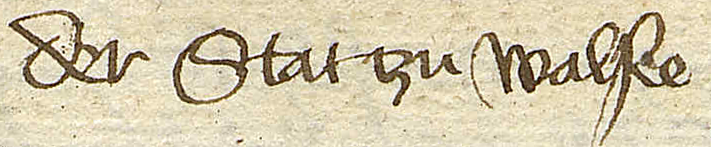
Der Stat cʒu Walſee
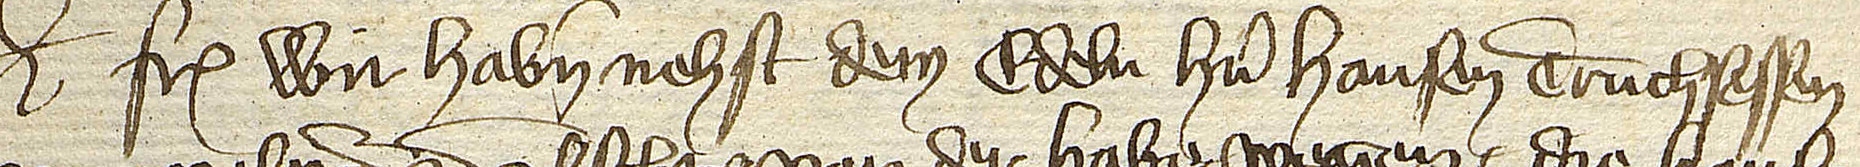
L* fr* wir habn* nehſt dem Edeln hn* hanſen Truchſeſſen
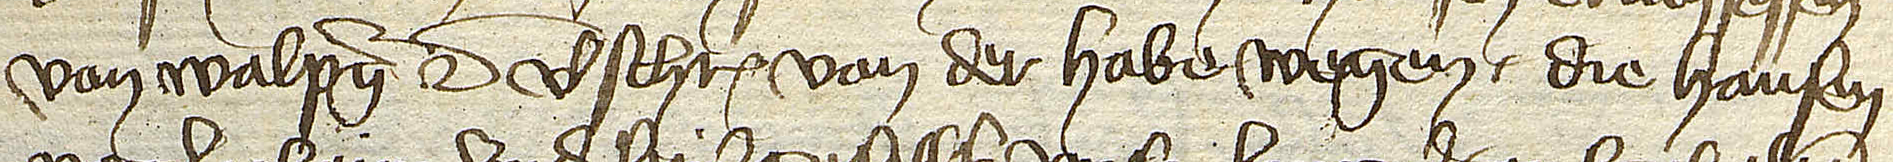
von walp*g et* v*ſchr* von der habe wegen / die hanſen
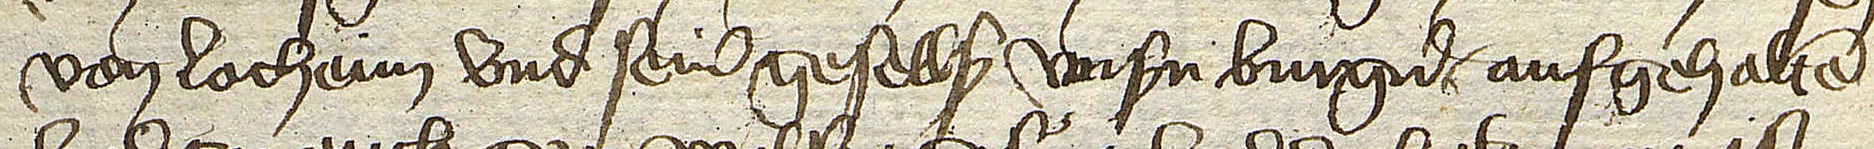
von locheim vnd ſein* geſellſ* vnſ*n burgn* / aufgehalte*
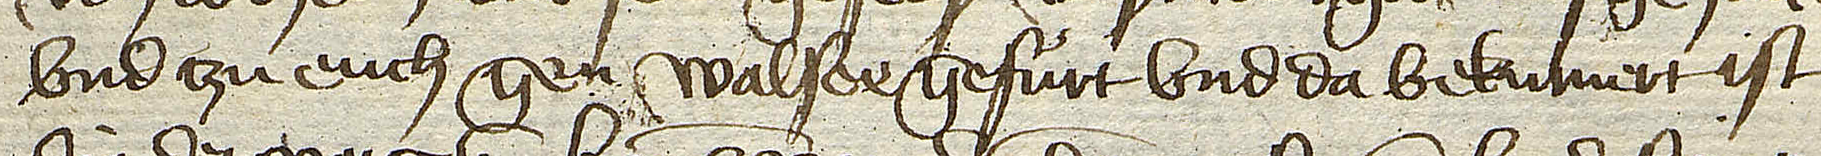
vnd cʒu euch gen walſee gefürt vnd da bekumert iſt
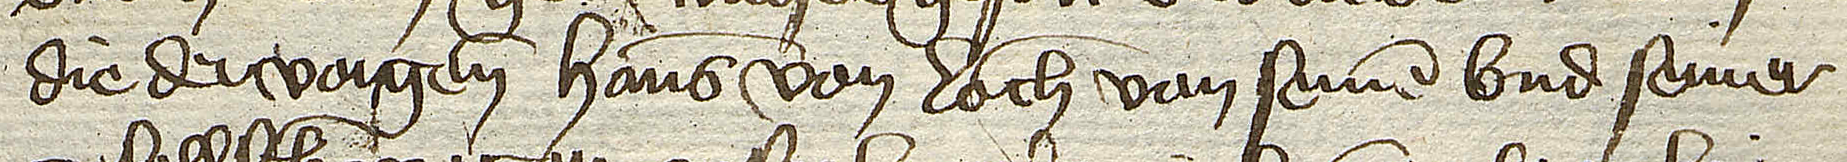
die der vorgen* hans*von loch* von ſeine* vnd ſeiner
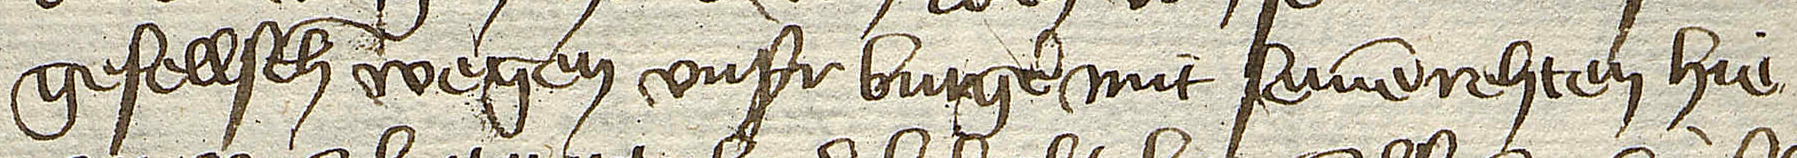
geſellſch* wegen vnſ*r burge* mit ſeine* rehten hie
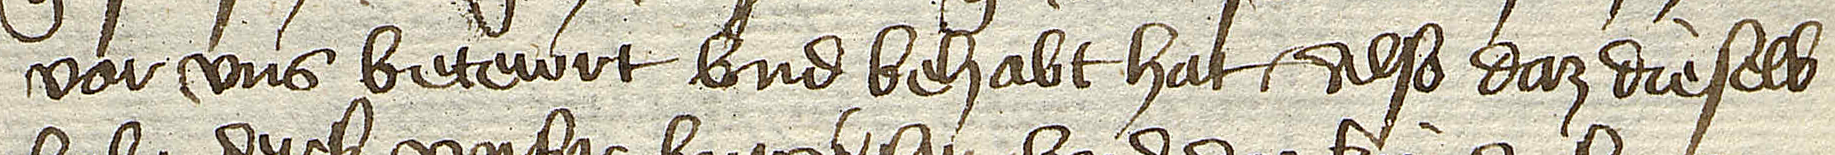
vor vns betewrt vnd behabt hat / Alſo daʒ dieſelb
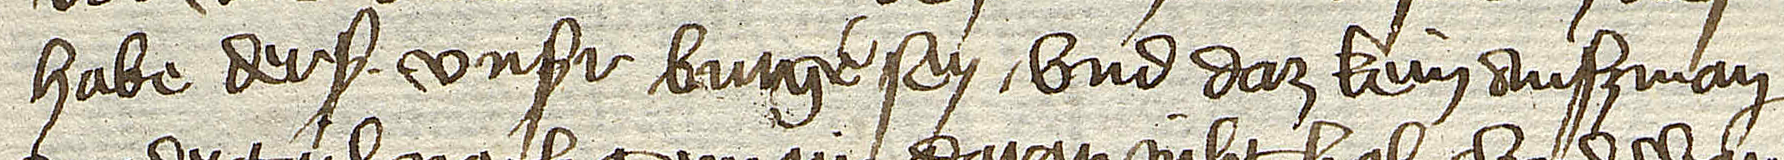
habe derſ* vnſ*r burge* ſey / vnd daʒ kein Auſʒman
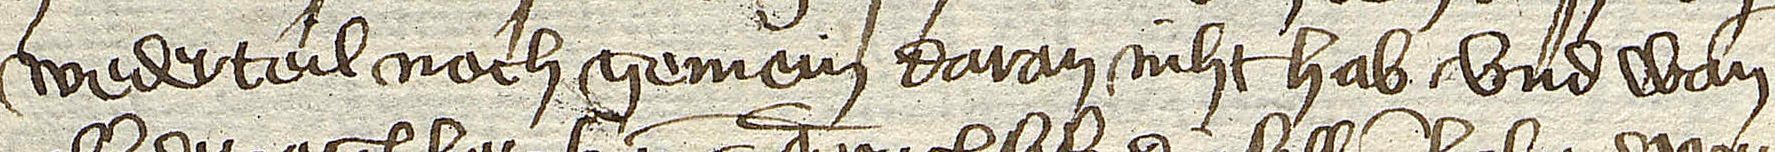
wederteil noch gemein daran niht hab / vnd wan*
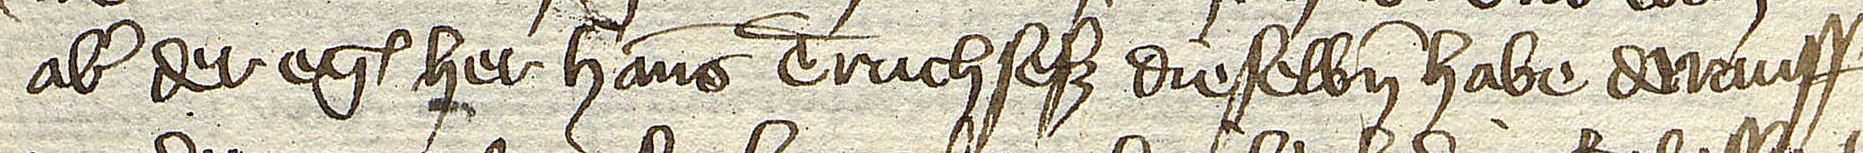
ab* der eg* her hans* Truchſeſʒ dieſelbn* habe darauff
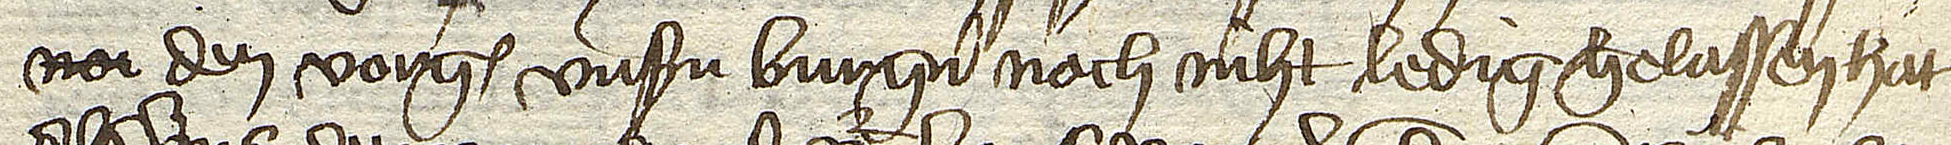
no den vorg* vnſ*n burgn* noch niht ledig gelaſſen hat
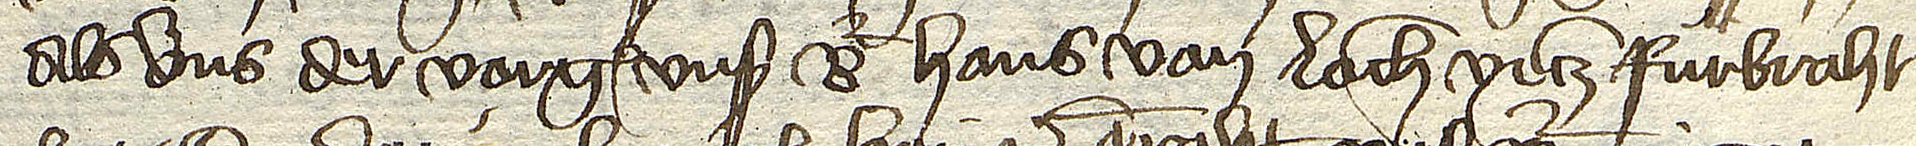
Als vns der vorg* vnſ* B* hans von loch* yecʒ* fürbraht
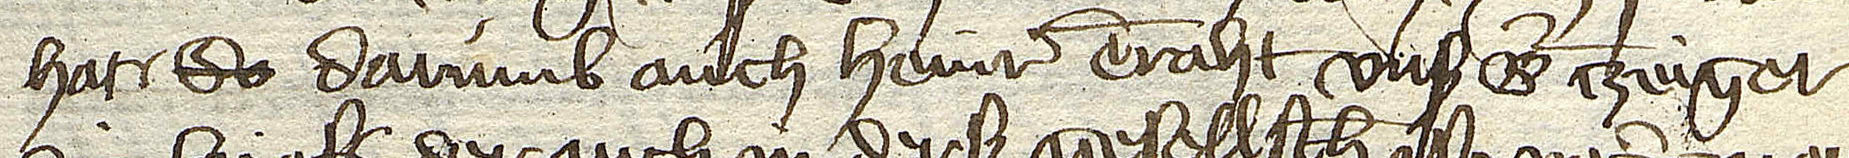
hat / So darümb auch heinr* Traht vnſ* B* cʒeiger
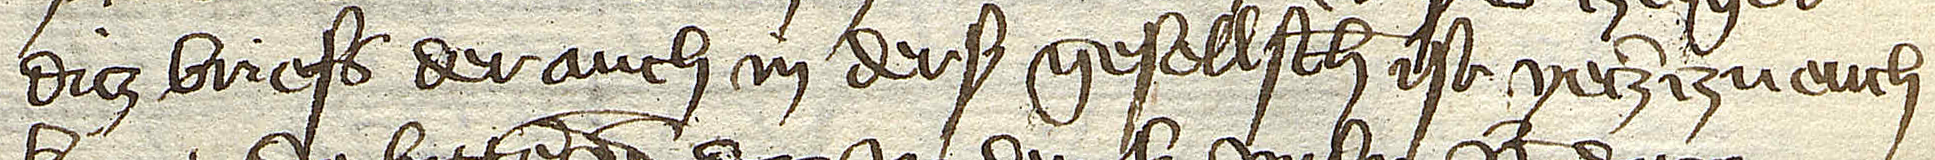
dicʒ briefs der auch in derſ* geſellſch* iſt yecʒ* cʒu euch
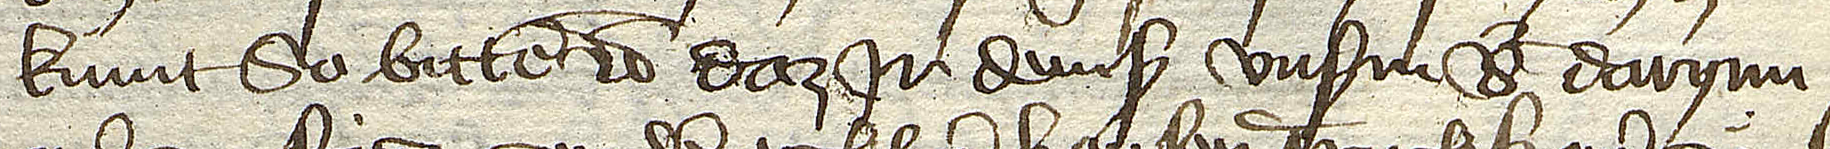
kümt So bitte* ec* daʒ Ir demſ* vnſ*m B* darynn
